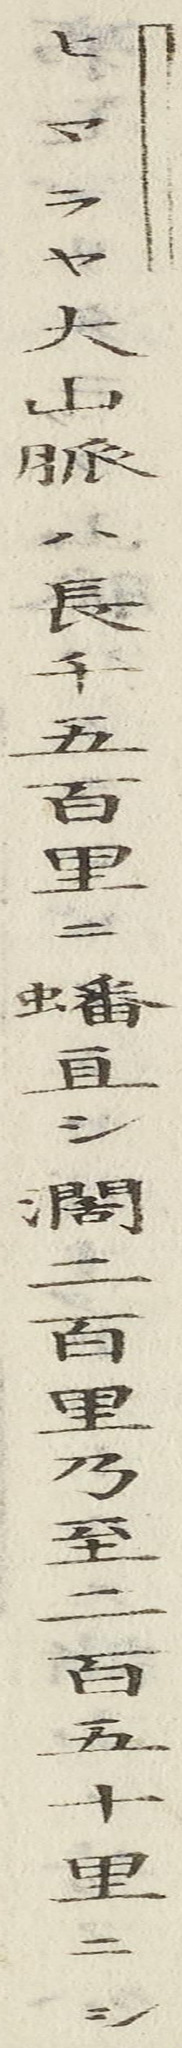ヒマラヤ大山脈ハ長千五百里ニ蟠亘シ濶二百里乃至二百五十里ニシ
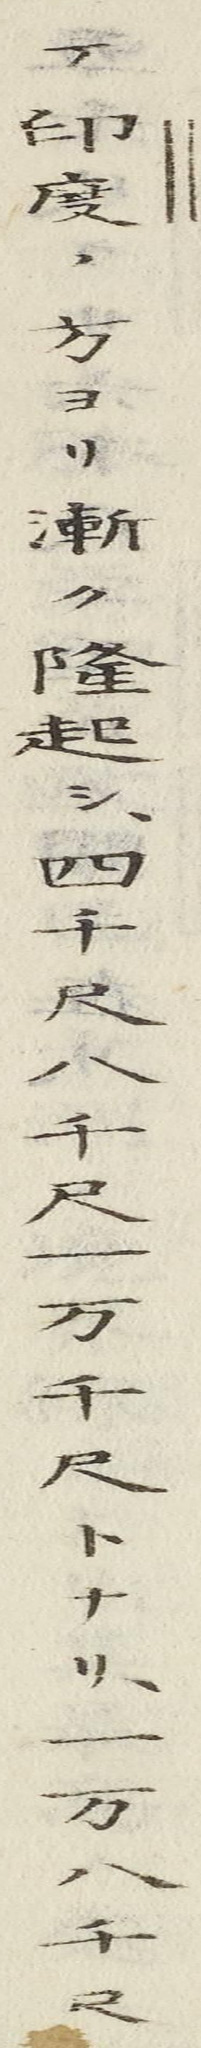テ印度ノ方ヨリ漸ク隆起シ、四千尺八千尺一万千尺トナリ、一万八千尺
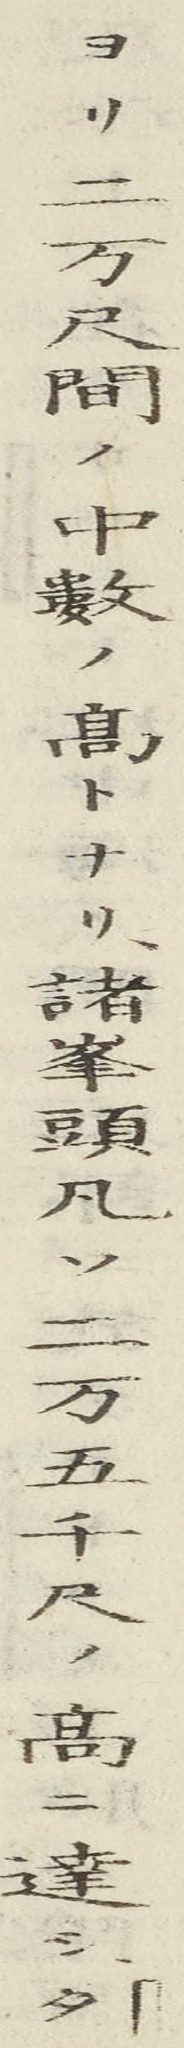ヨリ二万尺間ノ中数ノ高トナリ、諸峯頭凡ソ二万五千尺ノ高ニ達シ、タ
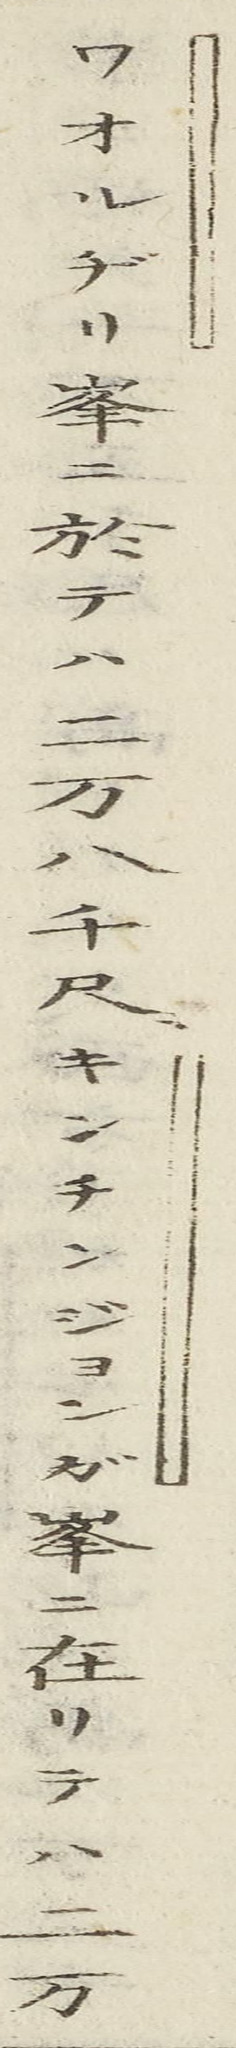ワオルヂリ峯ニ於テハ二万八千尺、キンチンジョンガ峯ニ在リテハ二万
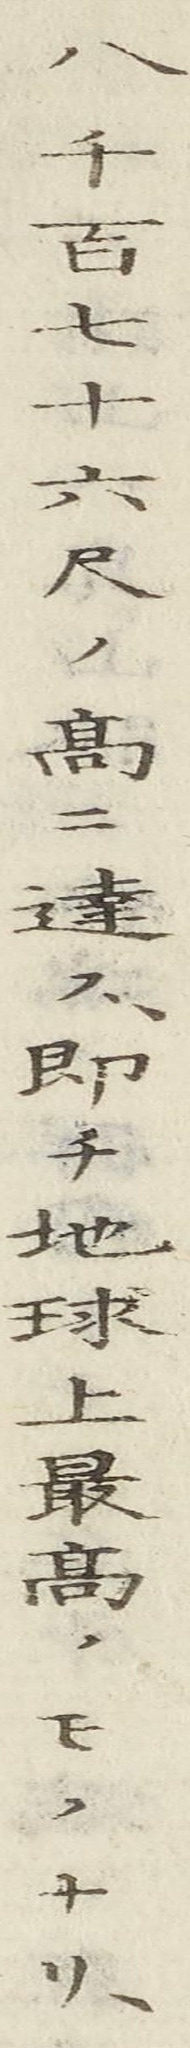八千百七十六尺ノ高ニ達ス、即チ地球上最高ノモノナリ、
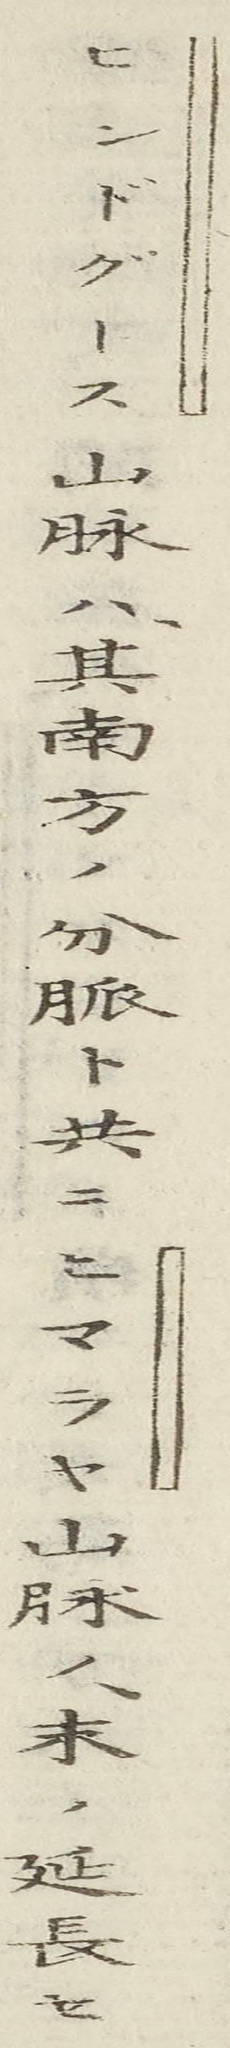ヒンドグース山脉ハ、其南方ノ分脈ト共ニヒマラヤ山脉ノ、未タ延長セ
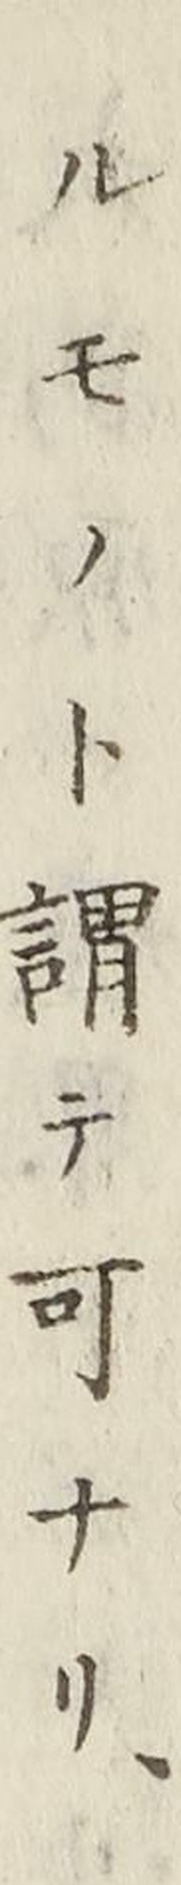ルモノト謂テ可ナリ、
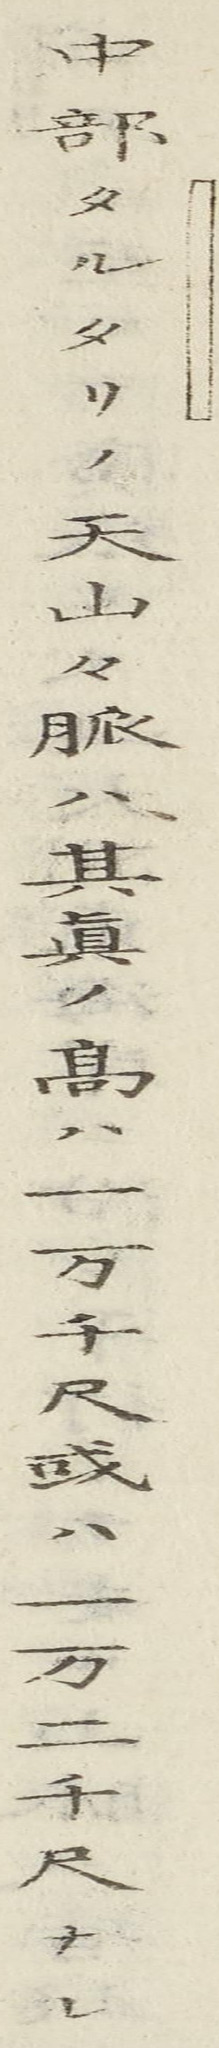中部タルタリノ天山々脈ハ、其眞ノ高ハ一万千尺或ハ一万二千尺ナレ
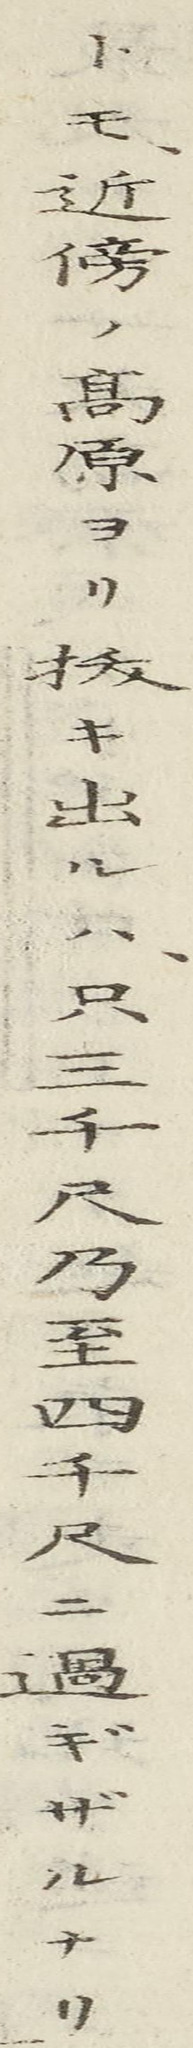トモ、近傍ノ高原ヨリ抜キ出ルハ、只三千尺乃至四千尺ニ過ギザルナリ」
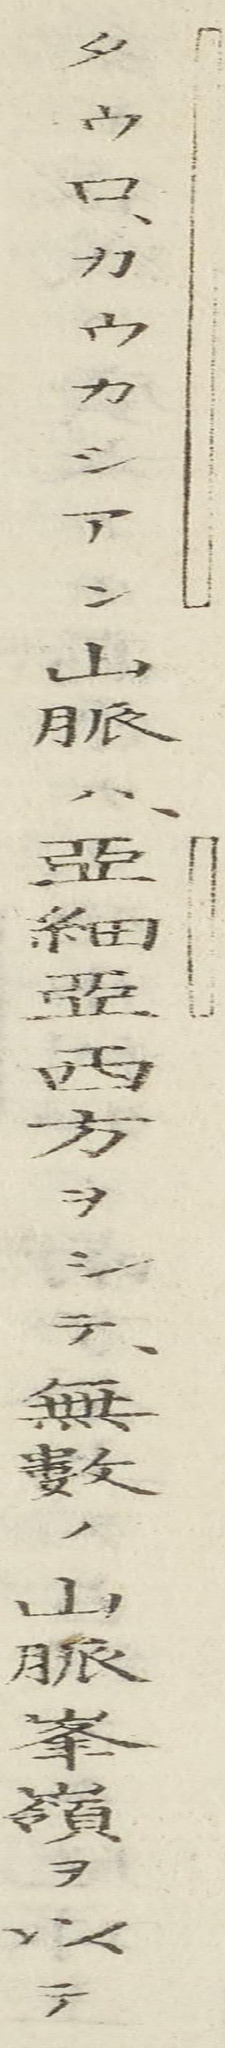タウロ、カウカシアン山脈ハ、亜細亜西方ヲシテ、無数ノ山脈峯嶺ヲ以テ
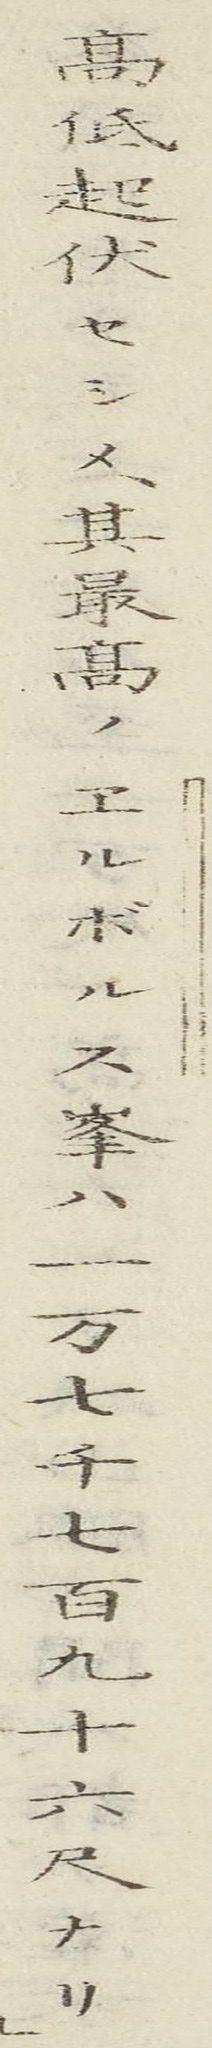高低起伏セシメ、其最高ノエルボルス峯ハ一万七千七百九十六尺ナリ」
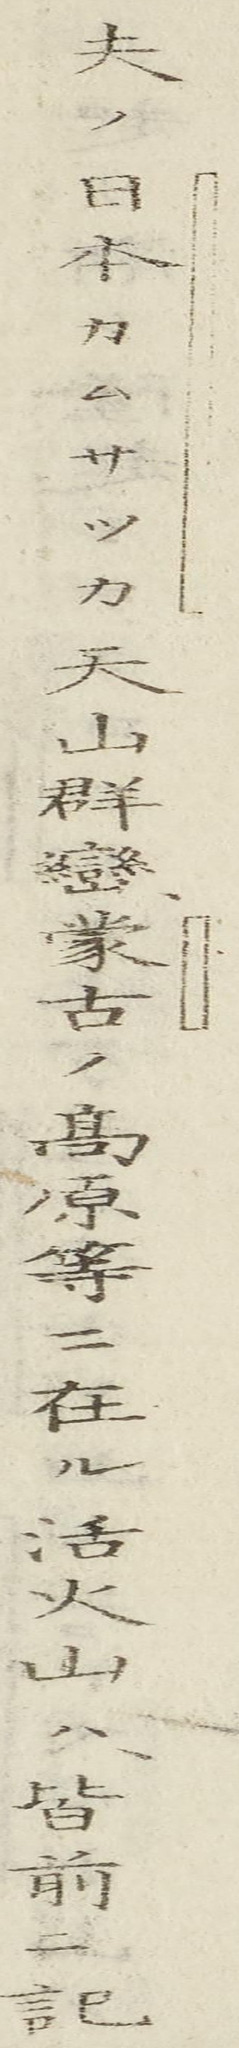夫ノ日本カムサツカ天山群巒、蒙古ノ高原等ニ在ル活火山ハ、皆前ニ記
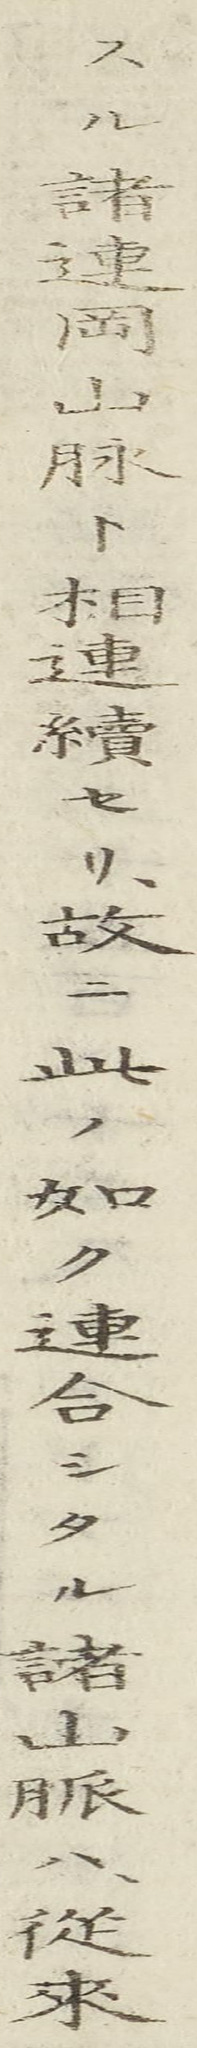スル諸連岡山脉ト相連続セリ、故ニ此ノ如ク連合シタル諸山脈ハ、従来
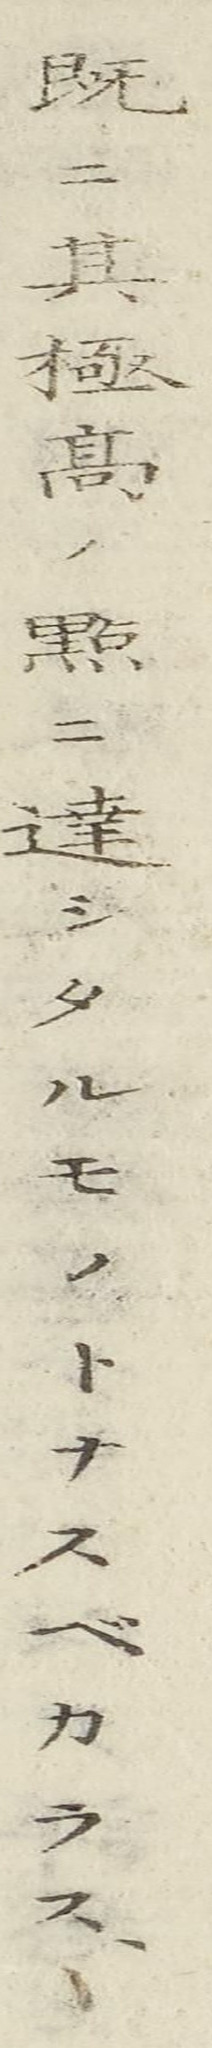既ニ其極高ノ点ニ達シタルモノトナスベカラス、

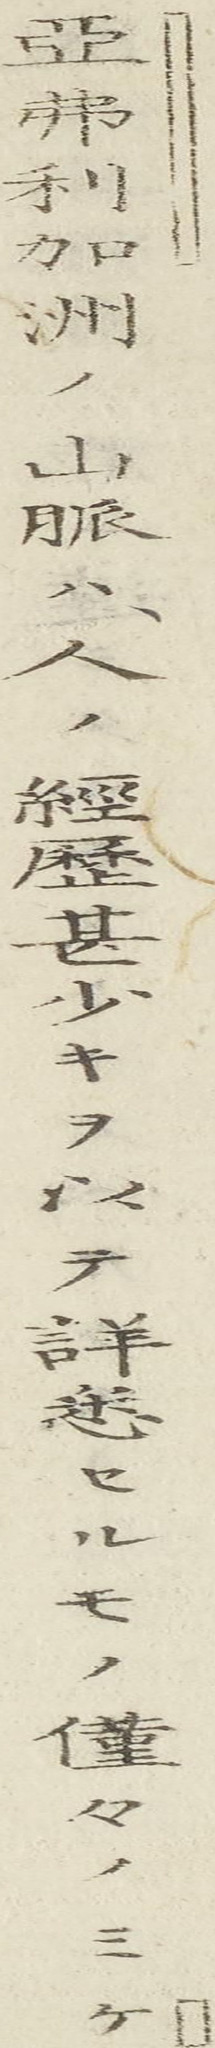阿弗利加洲ノ山脈ハ、人ノ経歴甚少キヲ以テ詳悉セルモノ僅々ノミケ
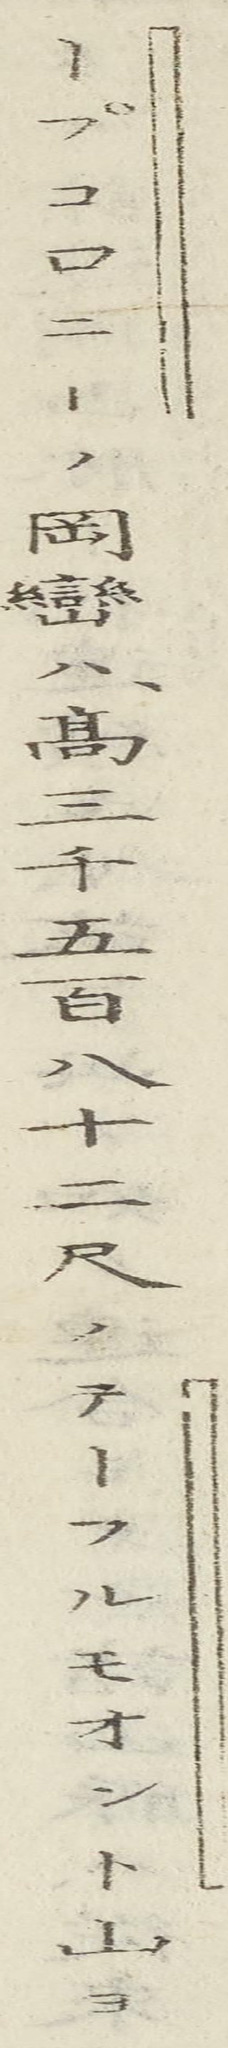ープコロニーノ岡巒ハ、高三千五百八十二尺ノテーフルモオント山ヨ
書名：百科全書　地文學　全
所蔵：東京大学地震研究所図書室 Earthquake Research Institute Library, The University of Tokyo, JAPAN
